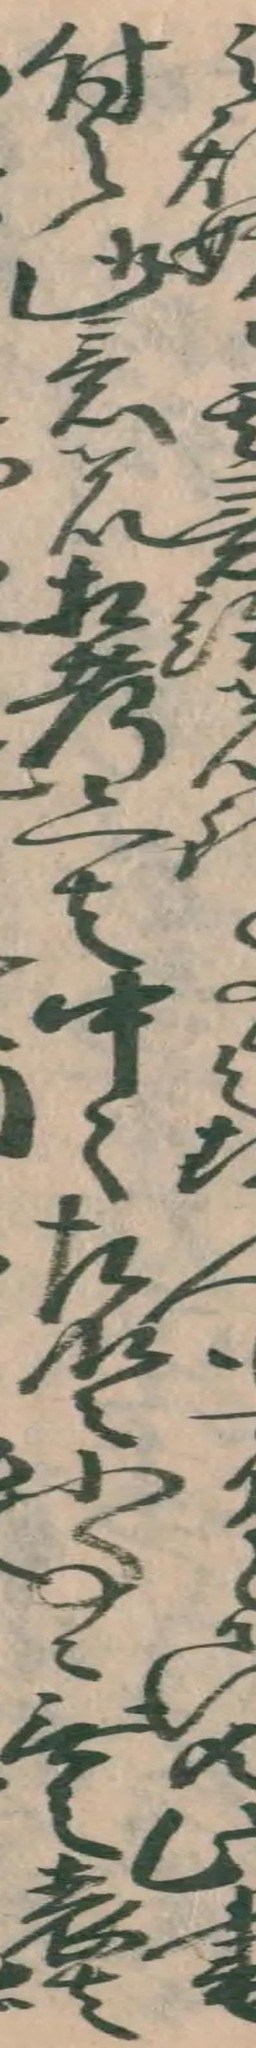付之趣意を以相考候へ者中々左様之小事ニ無之表者
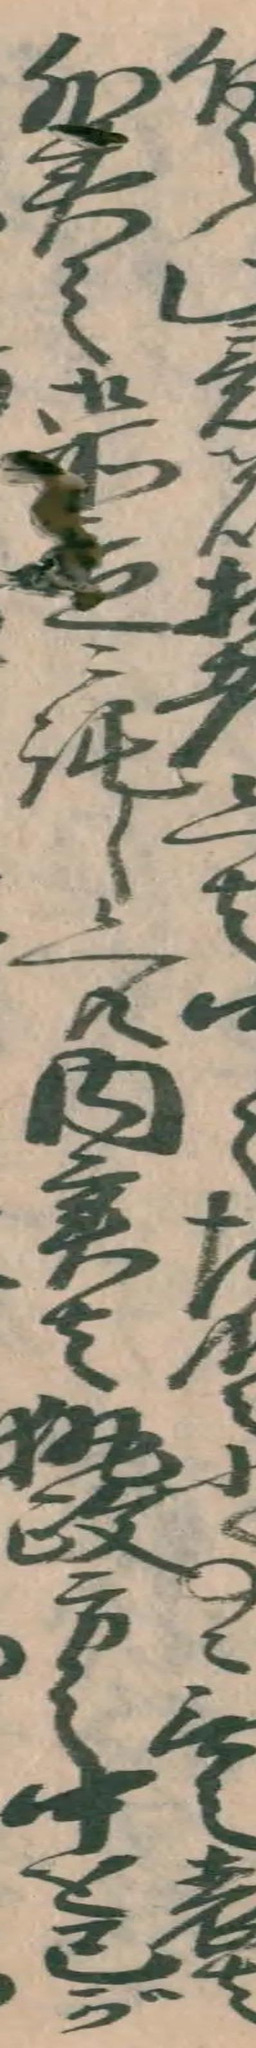外夷之御所置ニ託し候へ共内実者執政方之中を己が
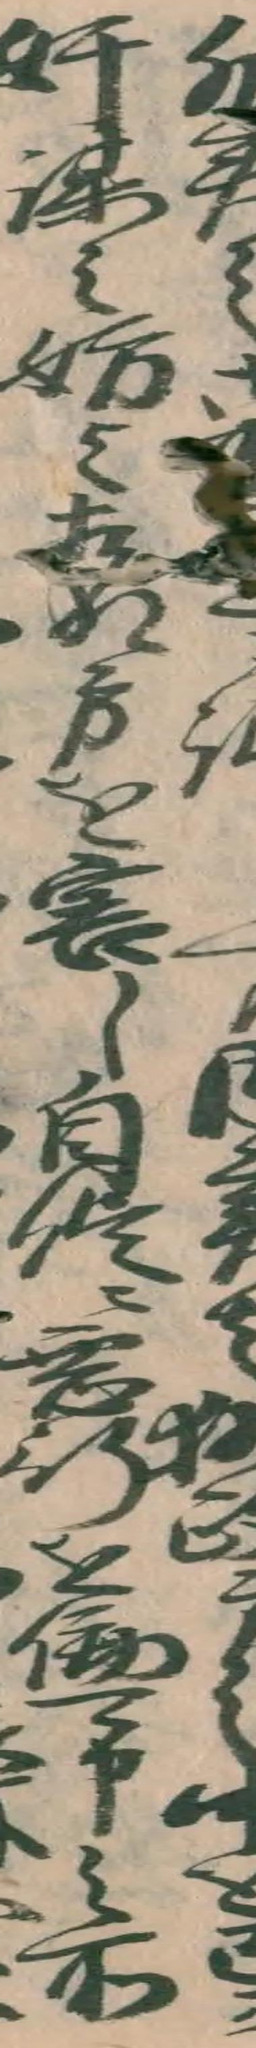奸謀之妨と相成方を害し自儘ニ悪行を働可申之所
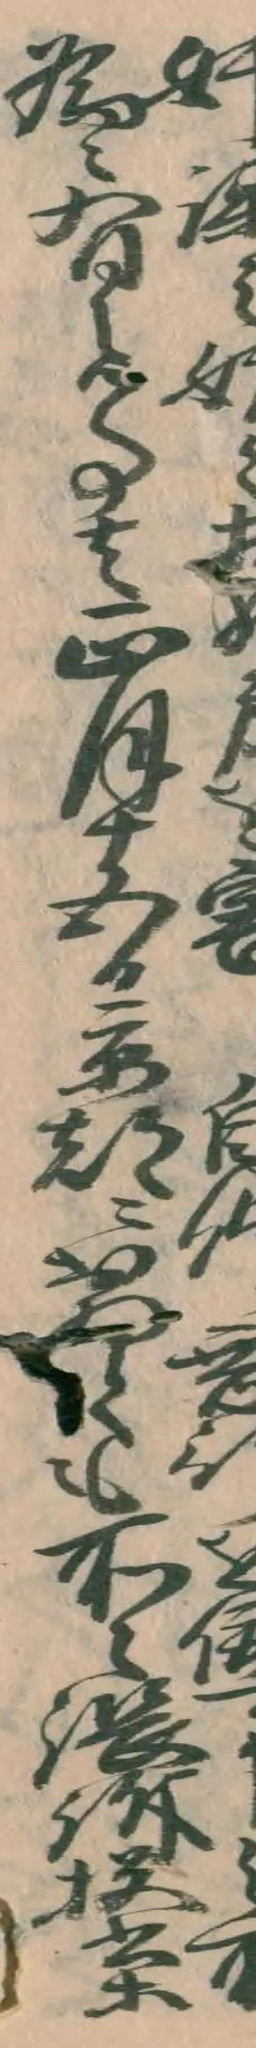為ニ有之候事者正月十五日京都ニおゐても所々張訴投書等
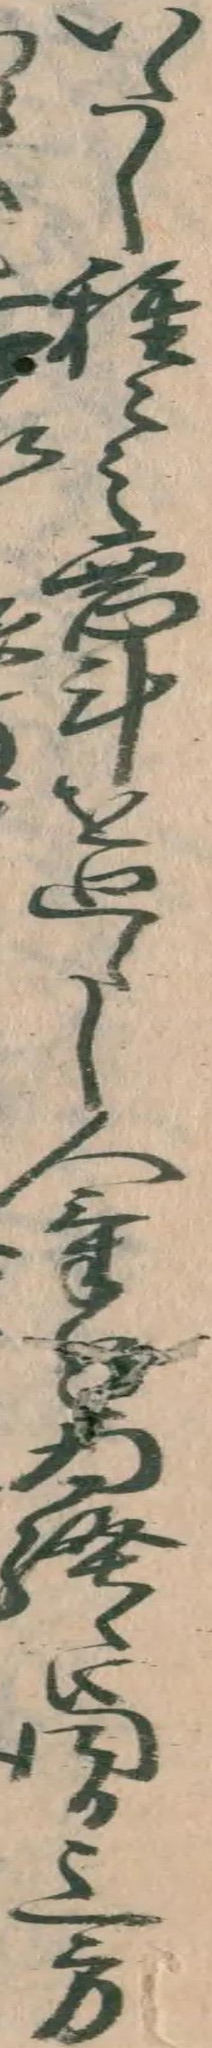いたし種々之悪斗を廻らし人気を為騒候由同日上方
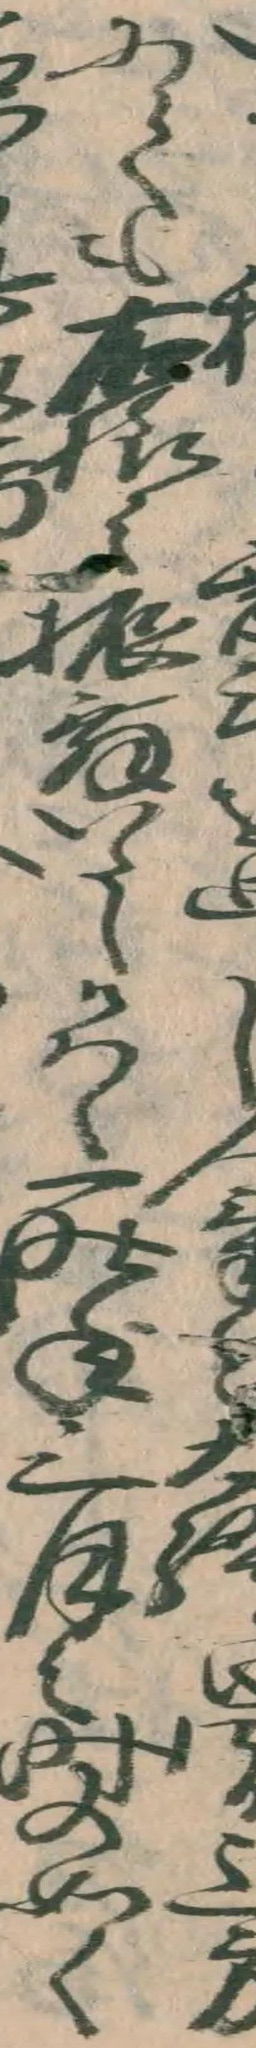にても右様之振舞いたし候ハヽ一昨年三月之時の如く
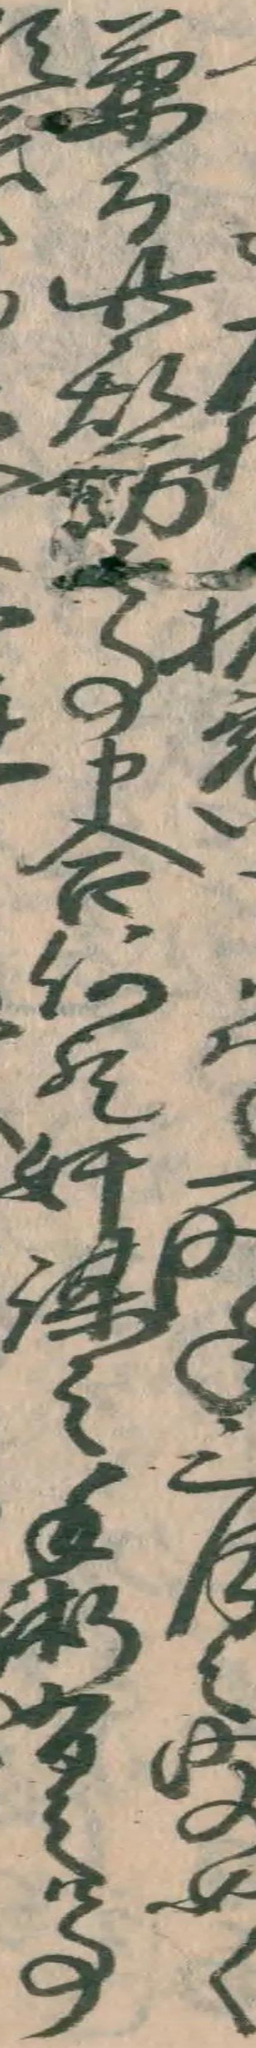兼而此乱妨之事申合何歟奸謀之手術有之候事
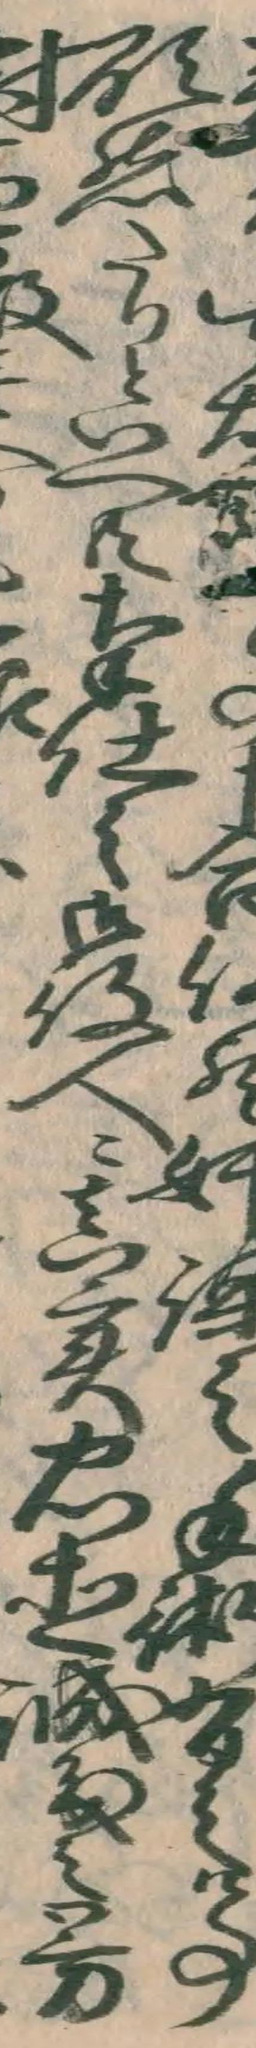顕然たりといへ共奉仕之御役人ニ真実忠直誠義之御方
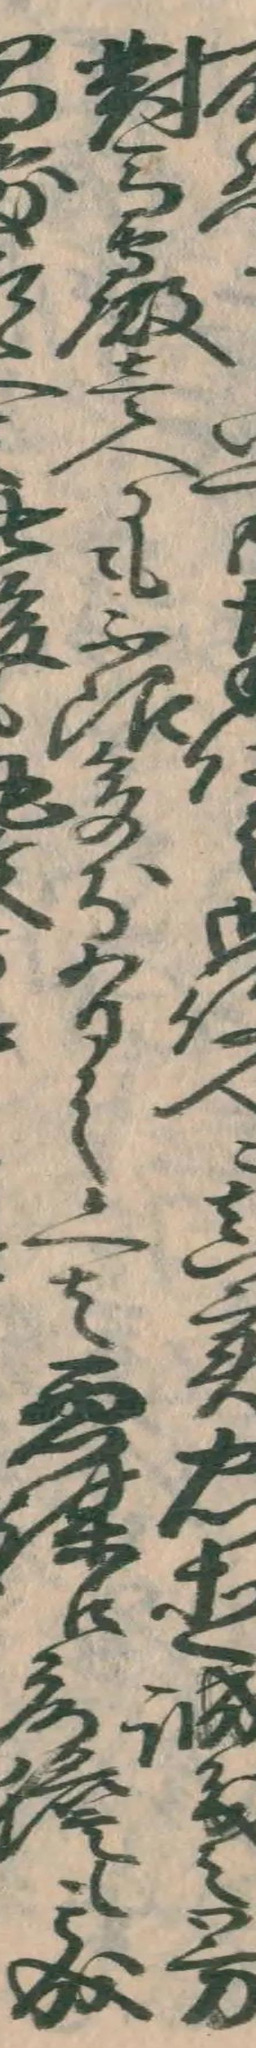對馬守殿壱人にも不限多分有之候へ者悪謀江荷膽も被成
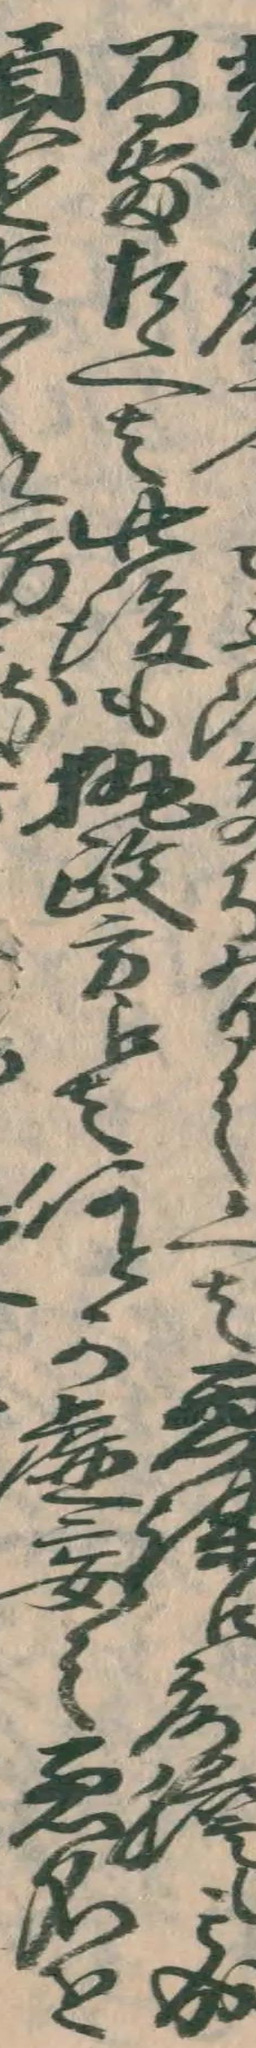間敷左候へ者此後も執政方江者何とか虚妄之悪名を
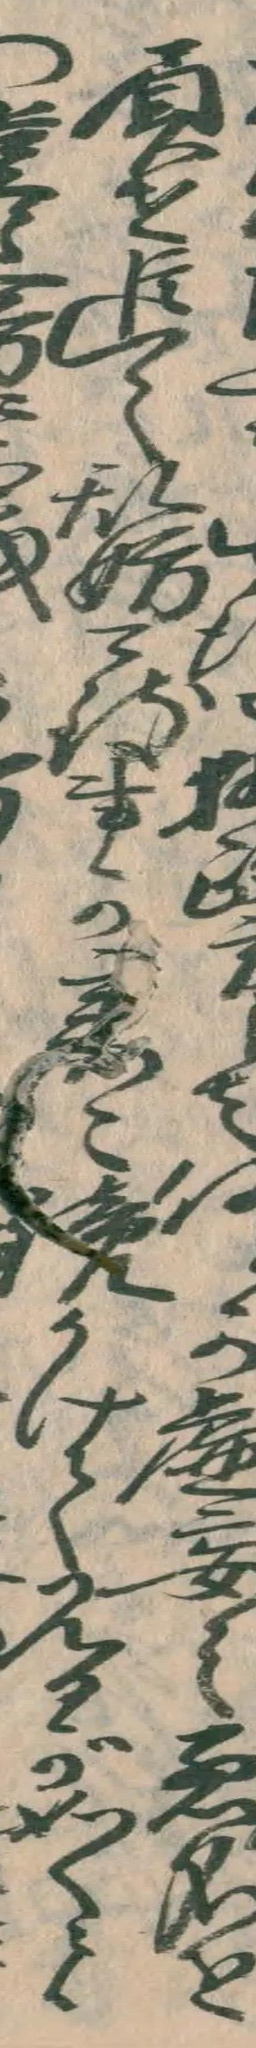負せ追々乱妨可致事か実ニ鏡かけて見るが如くニ候
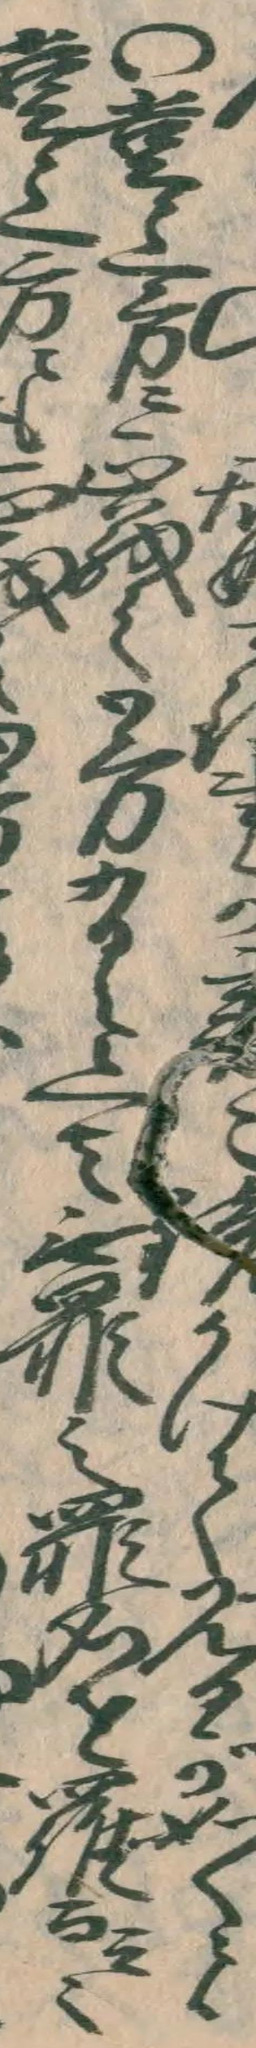○堂上方ニ正義之御方有之候へ者無罪之罪名を羅る云々
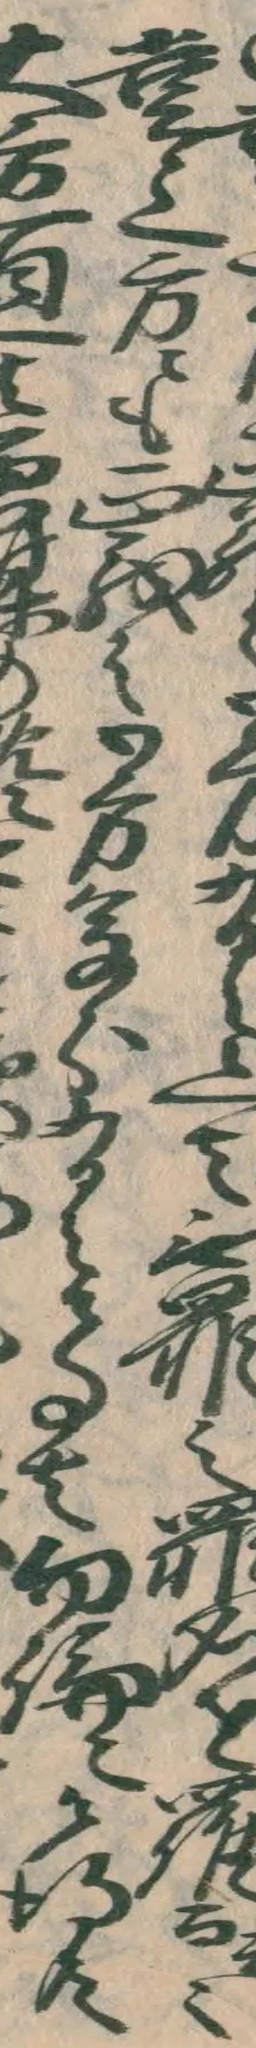堂上方ニも正義之御方多分有之候事者勿論ニ候得共
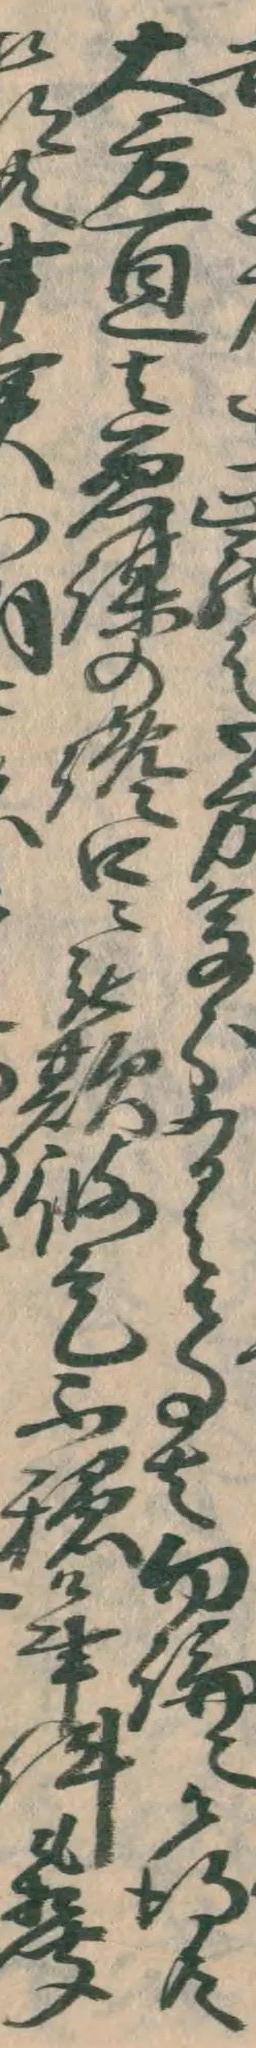大方一旦者悪謀の讒口ニ被欺彼是不穏候事件も相聞
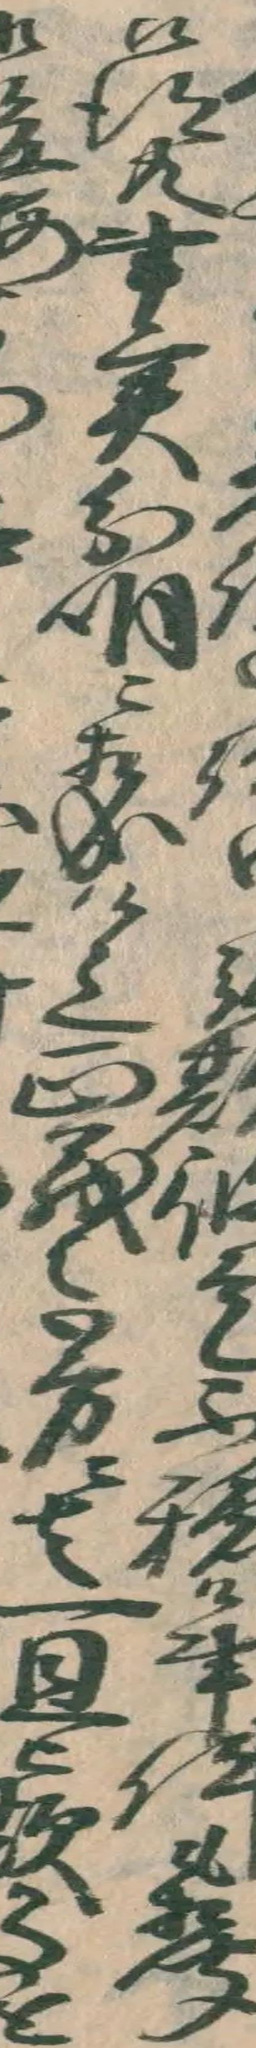候得共事実分明ニ相成候上正義之御方ニ者一旦被欺候事を
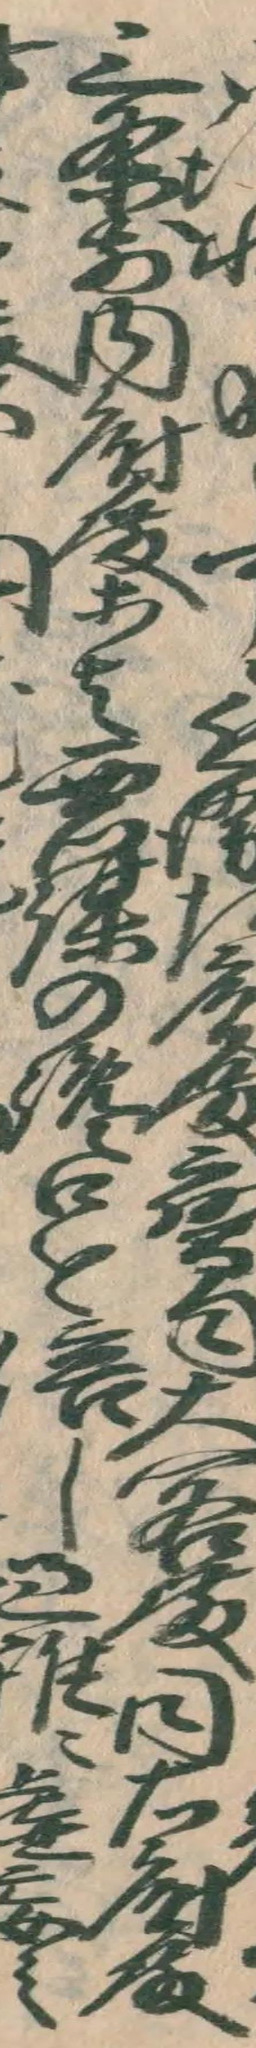三条前内府殿等者悪謀の讒口を倍し過雅ニ虚妄之
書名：麗斎叢書. 20
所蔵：国立国会図書館 National Diet Library, JAPAN
